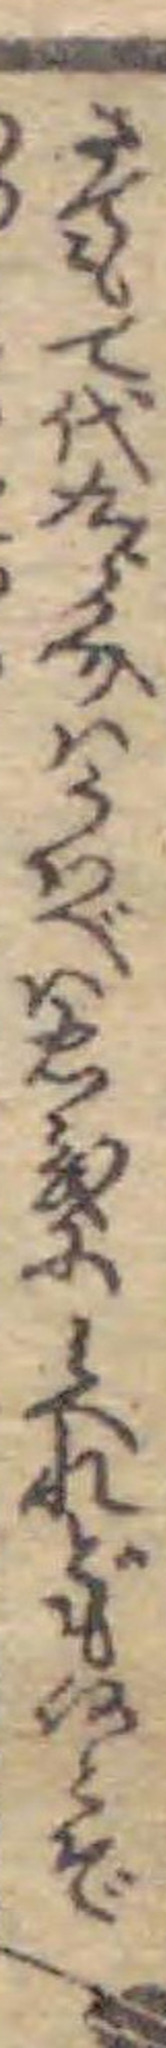さてもて代九郎介はうはべは忠義にみへれども何とぞ
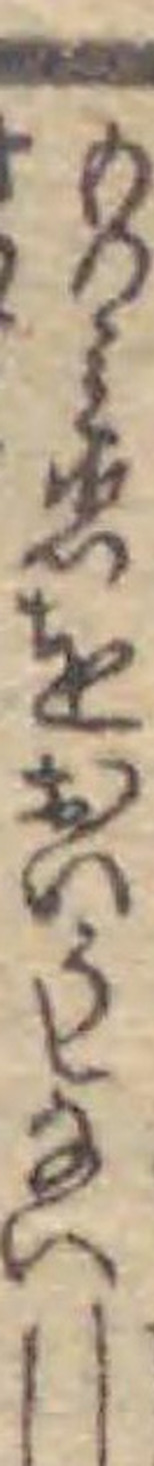もりの丞をおいうしない
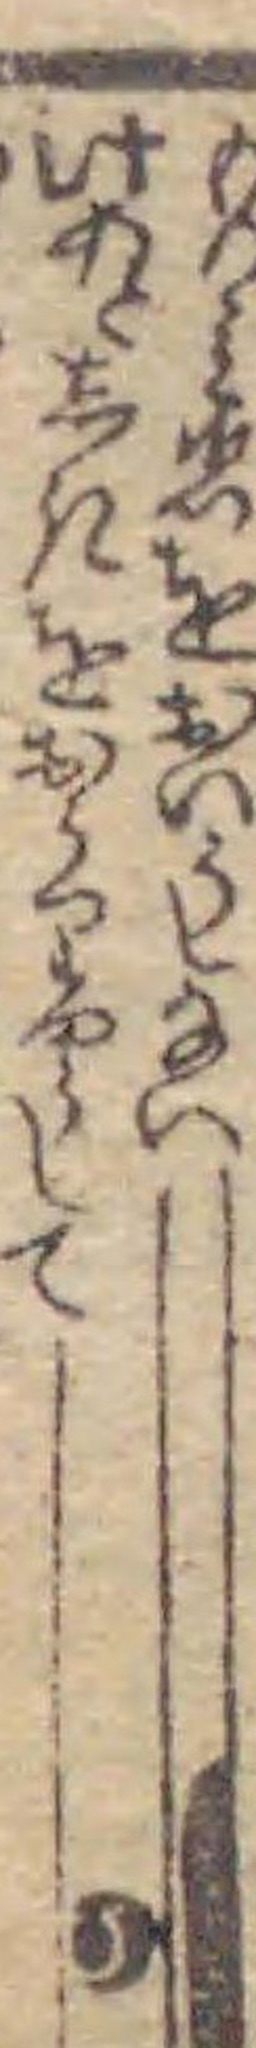此あとしきをおうりやうして
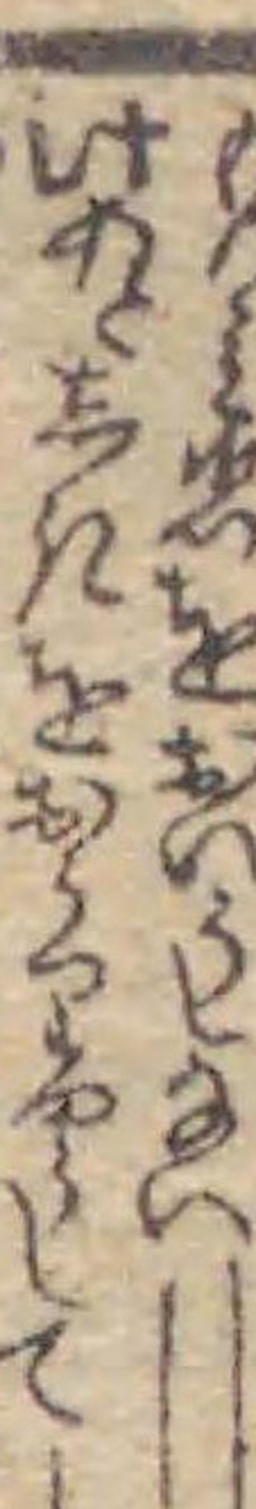此あとしきをおうりやうして
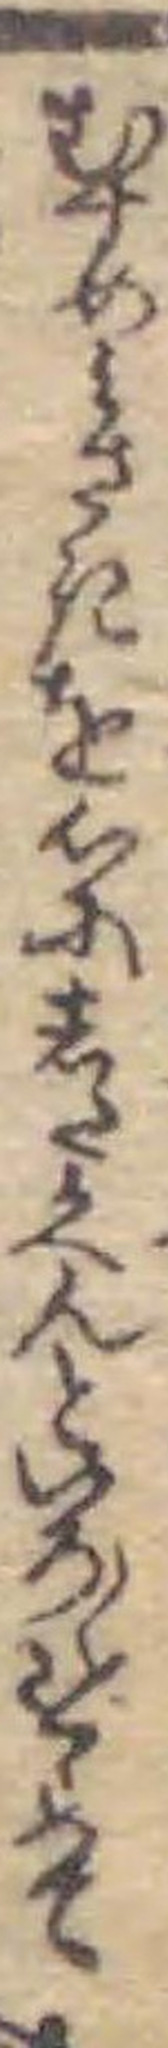むすめみさきを心にしたかへんといろ〳〵すゝめて
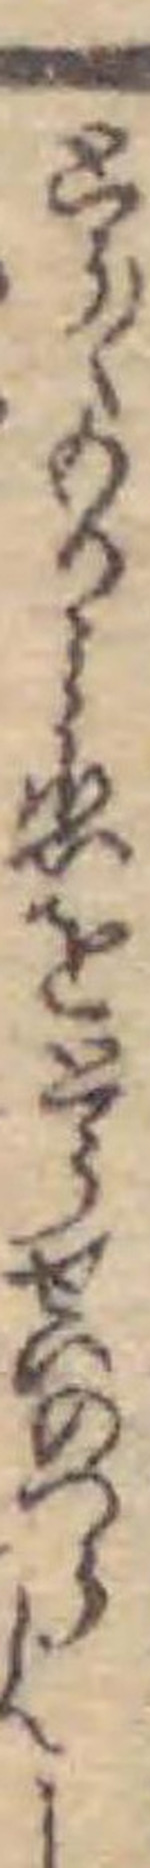とう〳〵もりの丞をとうせいのつうじん
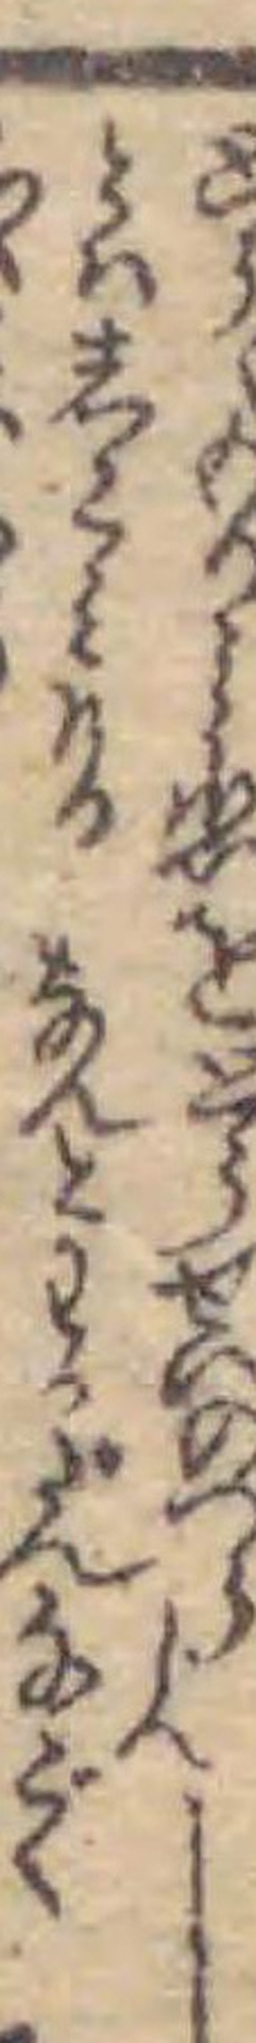とはしこみけるなんとわかだんなごく
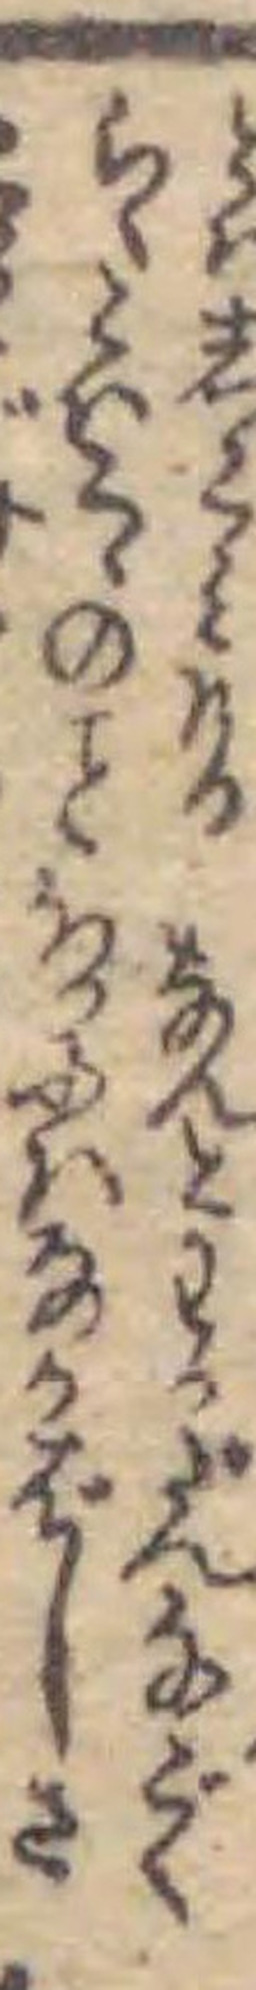らくとはこゝのことほかにはなかばしさ
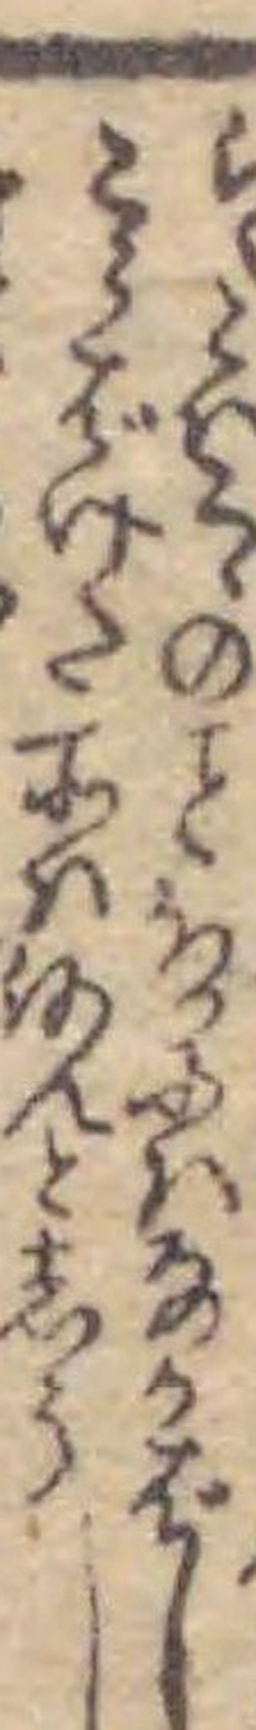こうばけた所は何としう
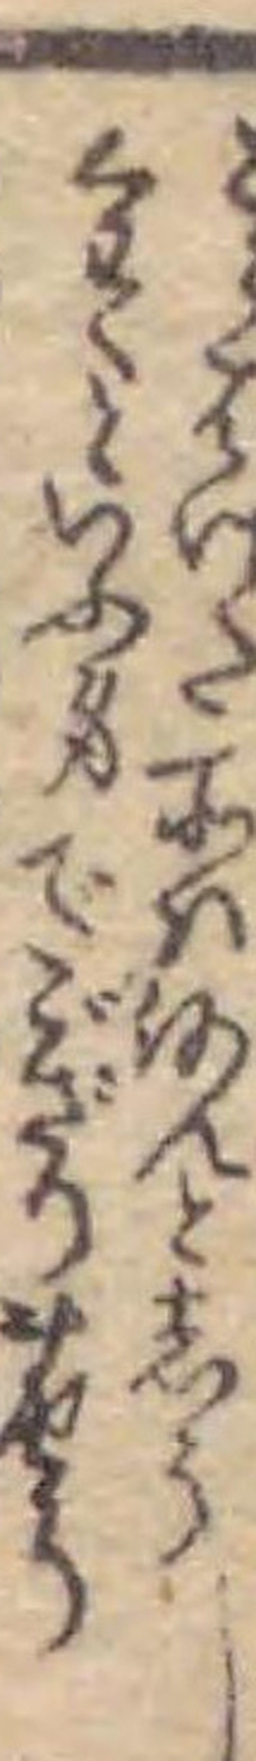くわくといふ身でござりませう
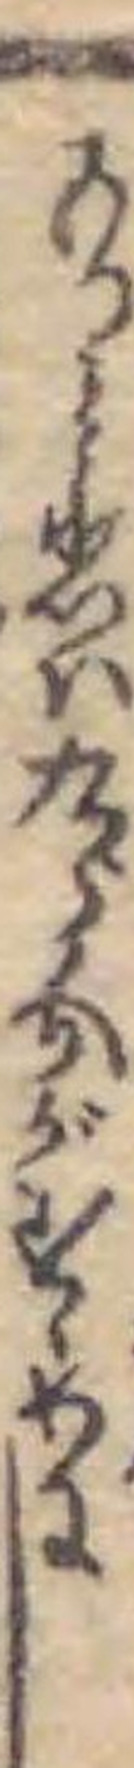もりの丞は九郎介がすゝめに
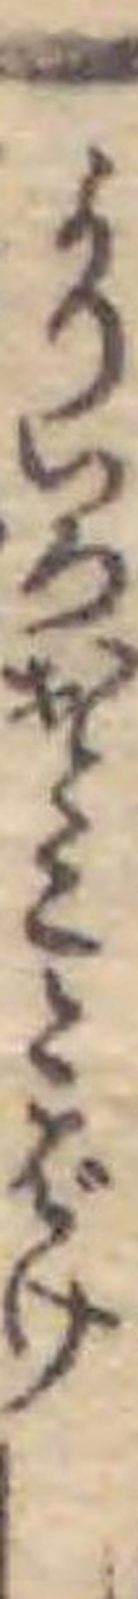よりいろおとことばけ
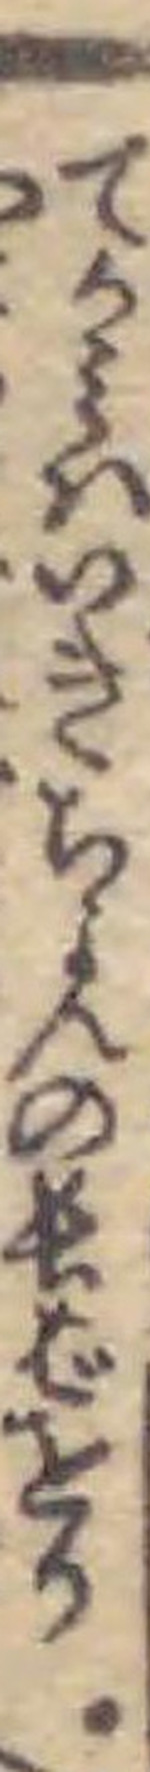てかみはいきちよんの長ばをり
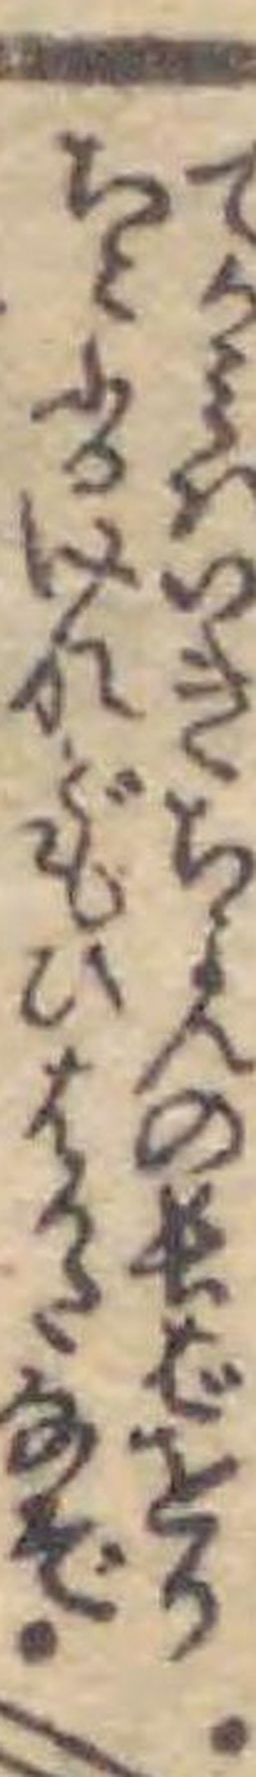ちとふるけれどもひはかたなぞ
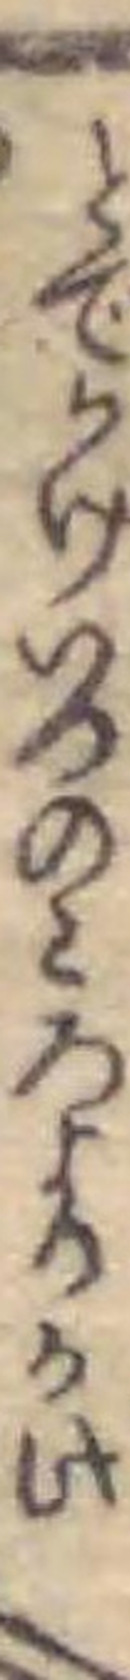とでかけいつのころよりか此
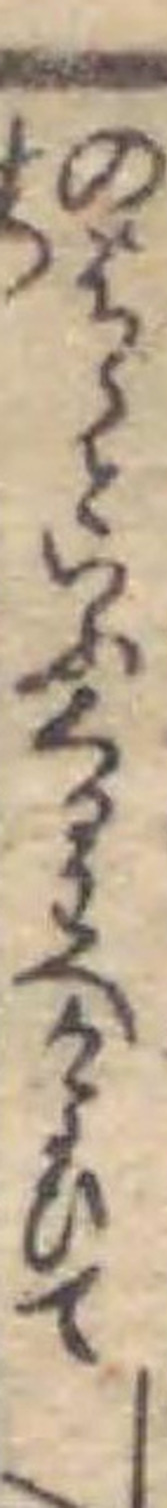のはらといふくるわへかよひて
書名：扨化狐通人 : 2巻
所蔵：国立国会図書館 National Diet Library, JAPAN
